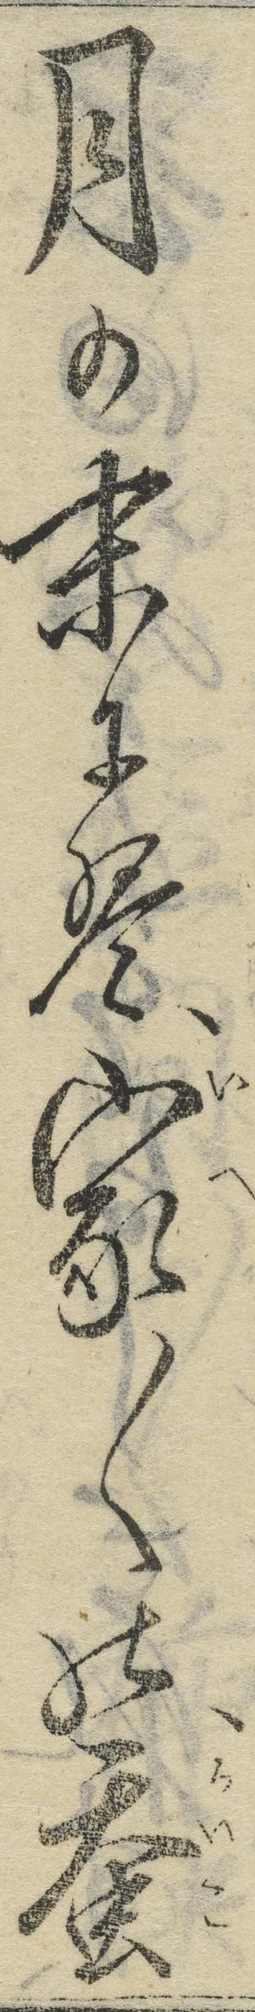月の末には、家〱の、蚕
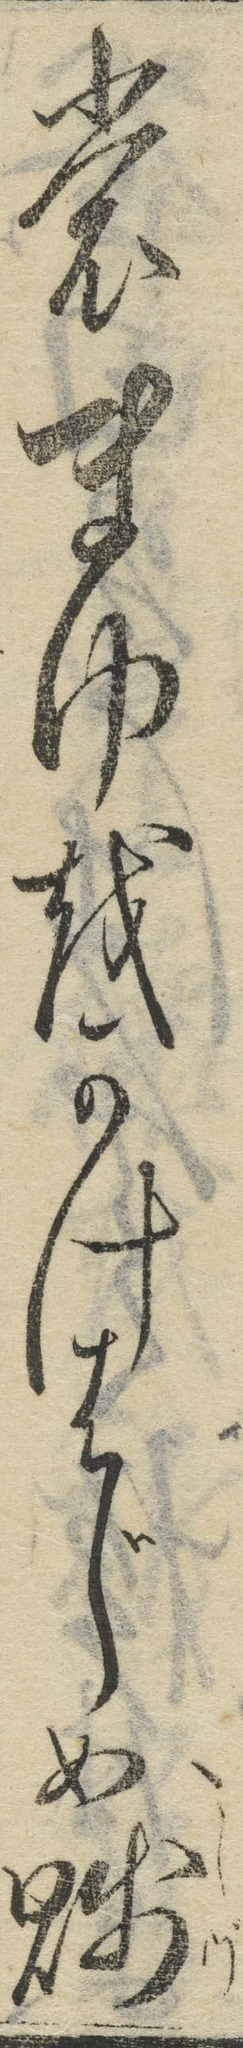もまゆをかけはじめ、賤
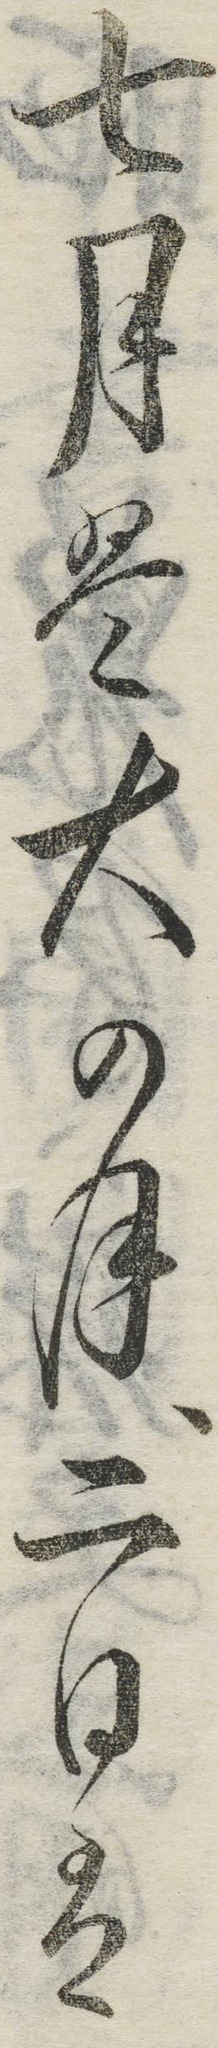七月は大の月、二日は
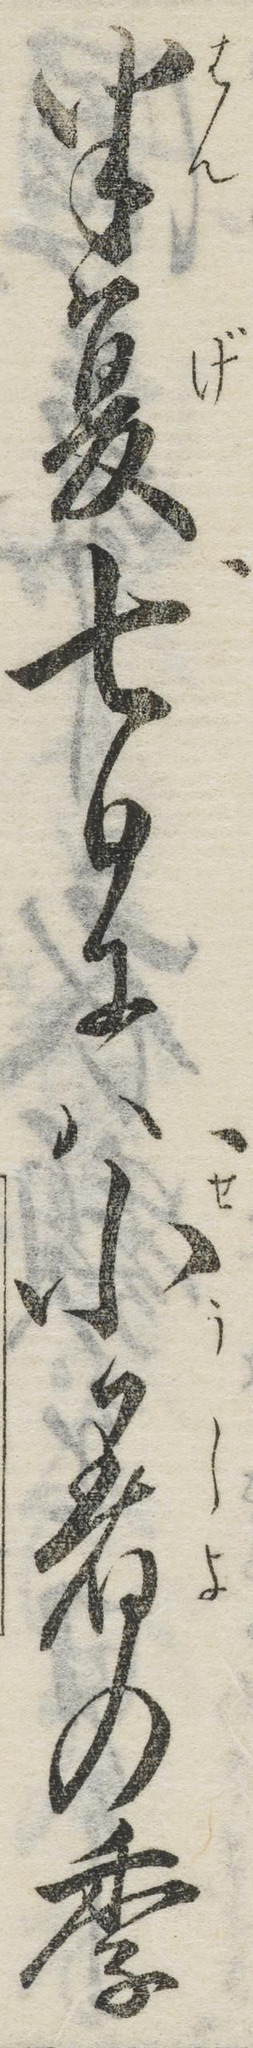半夏、七日には、小暑の季
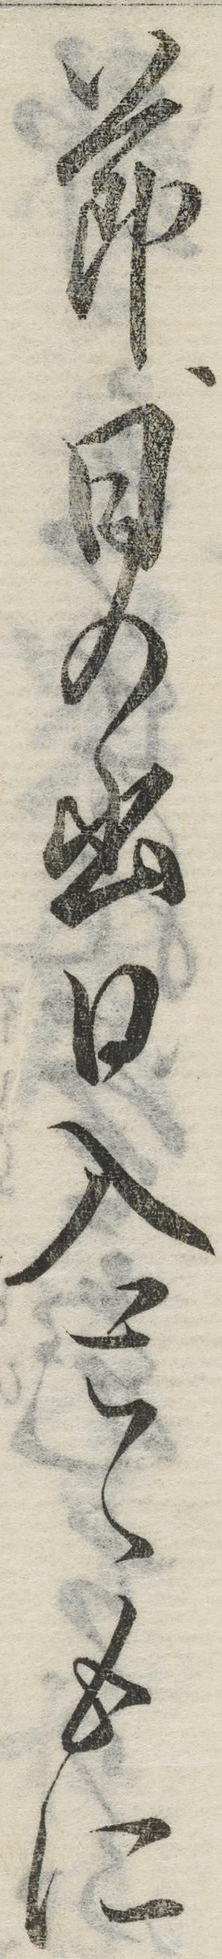節、日の出日入とゝもに
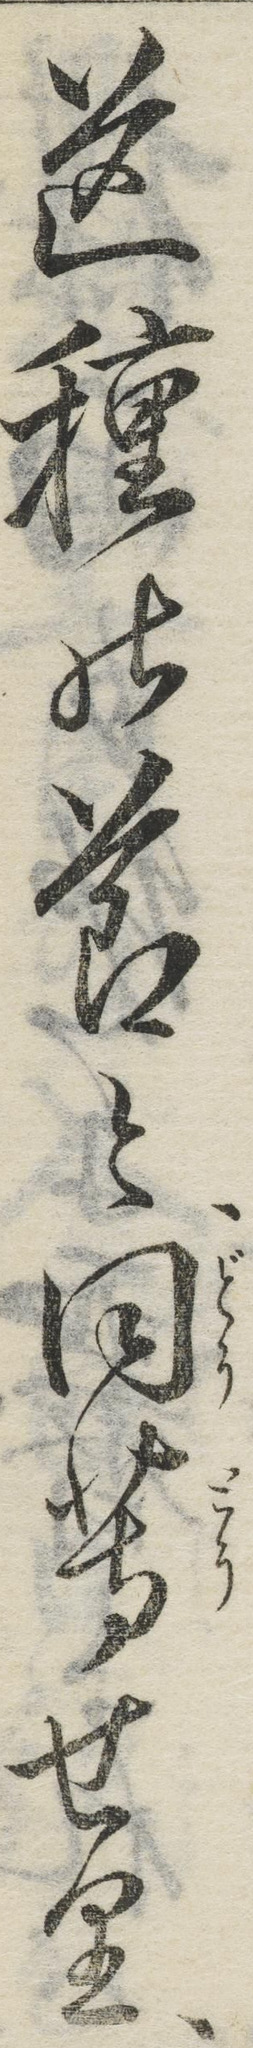芒種の節と、同等せり、

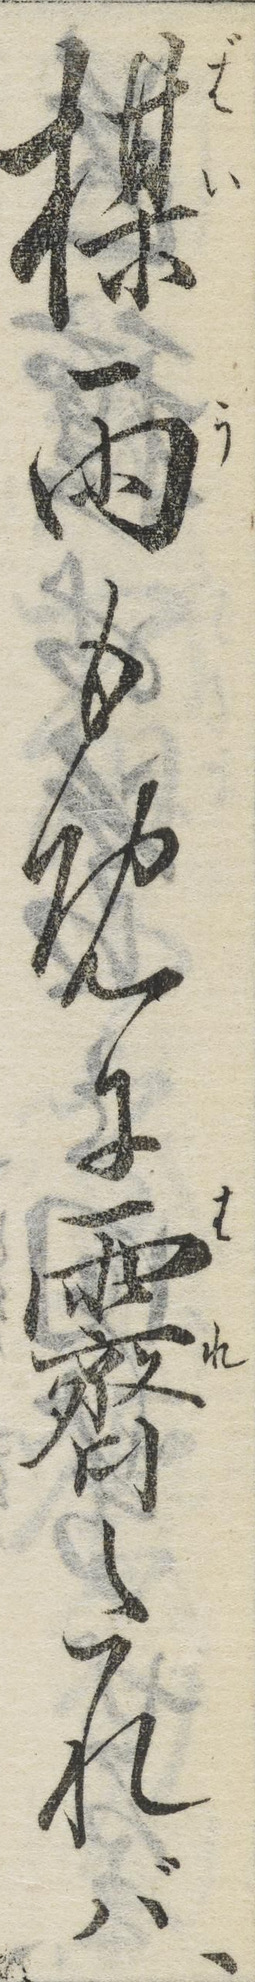楳雨も既に霽たれば、
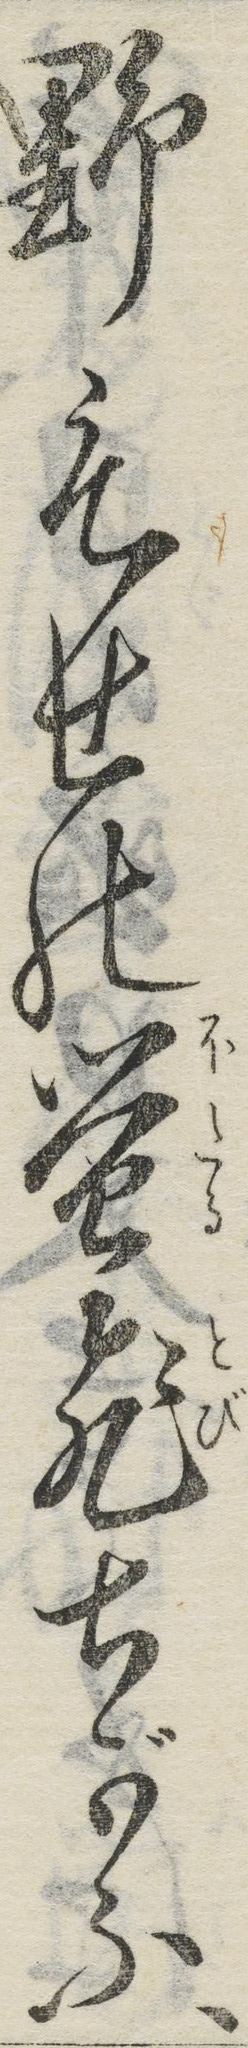野もせの蛍飛ちがふ、
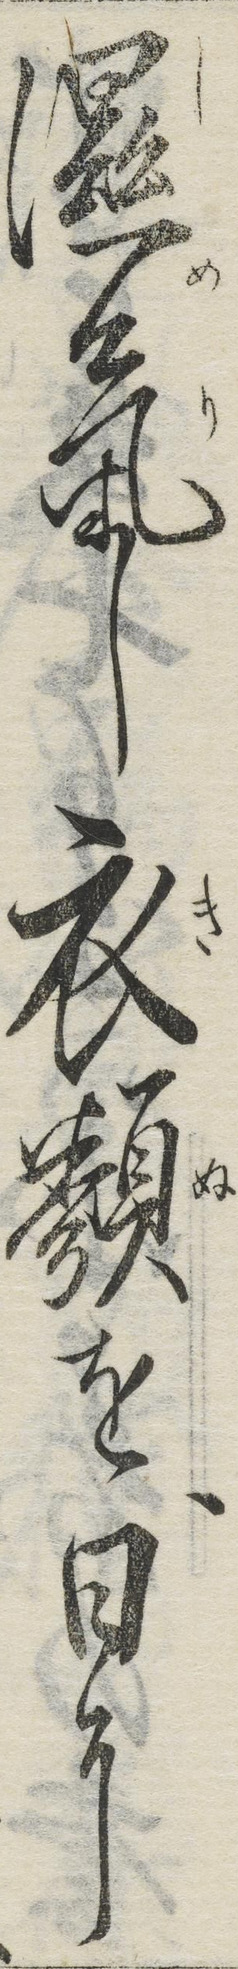湿気し衣類を、日に、
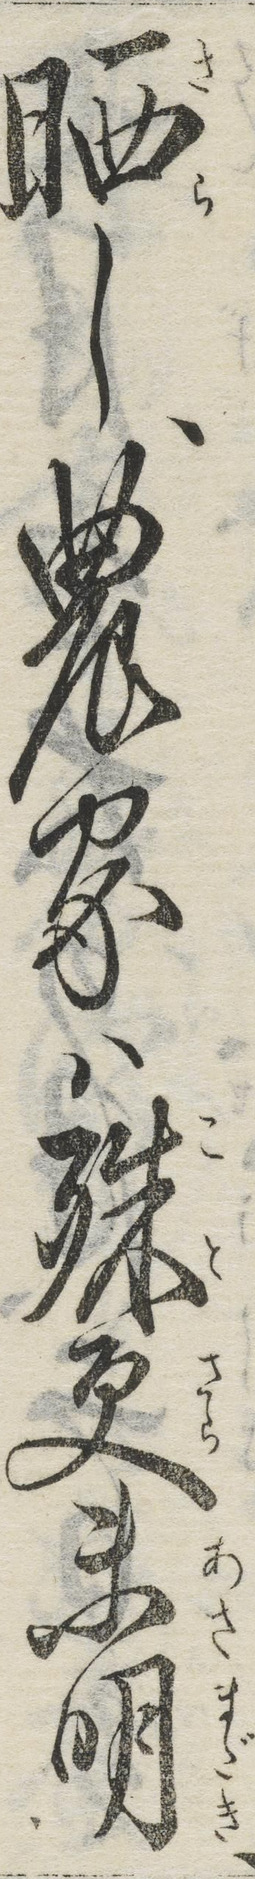晒し、農家は殊更未明、
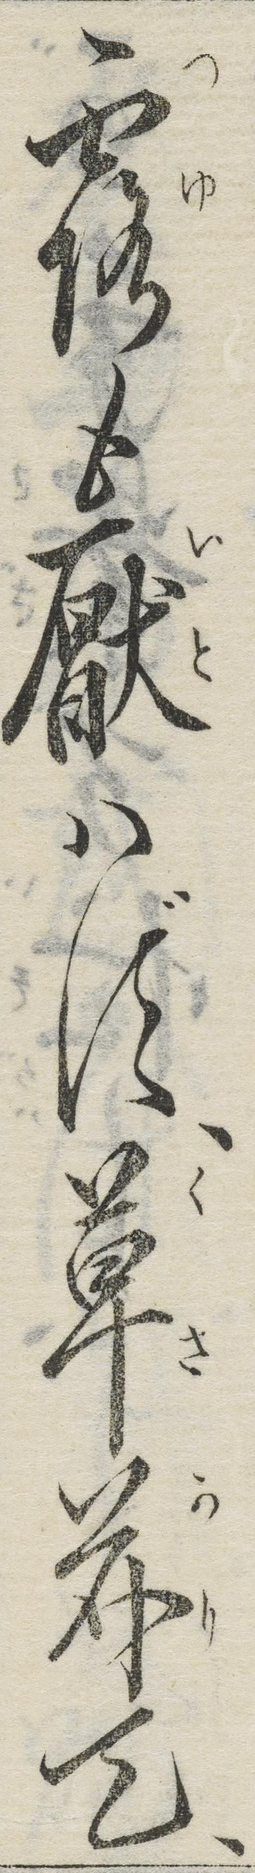露も厭はず、草苅て、
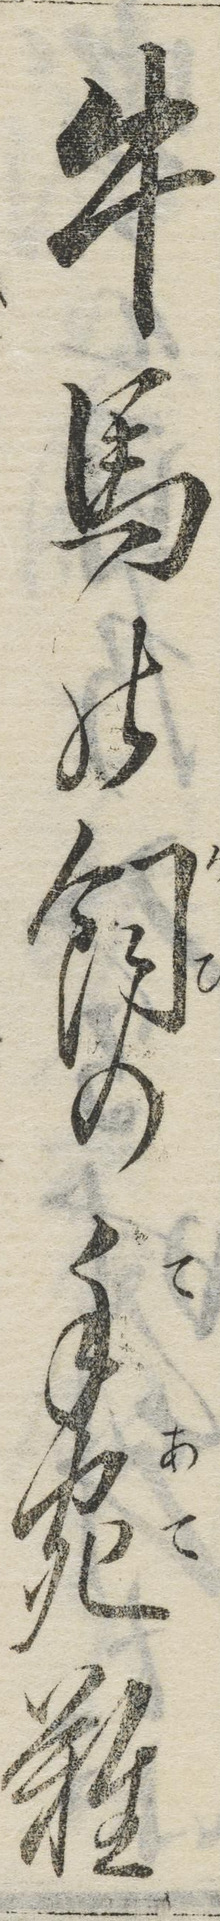牛馬の飼の手宛な
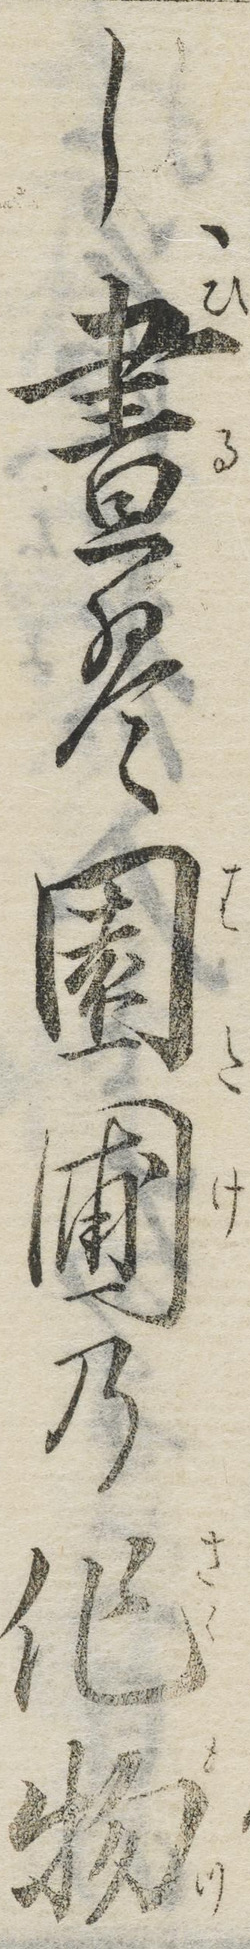し、昼は園圃の作物
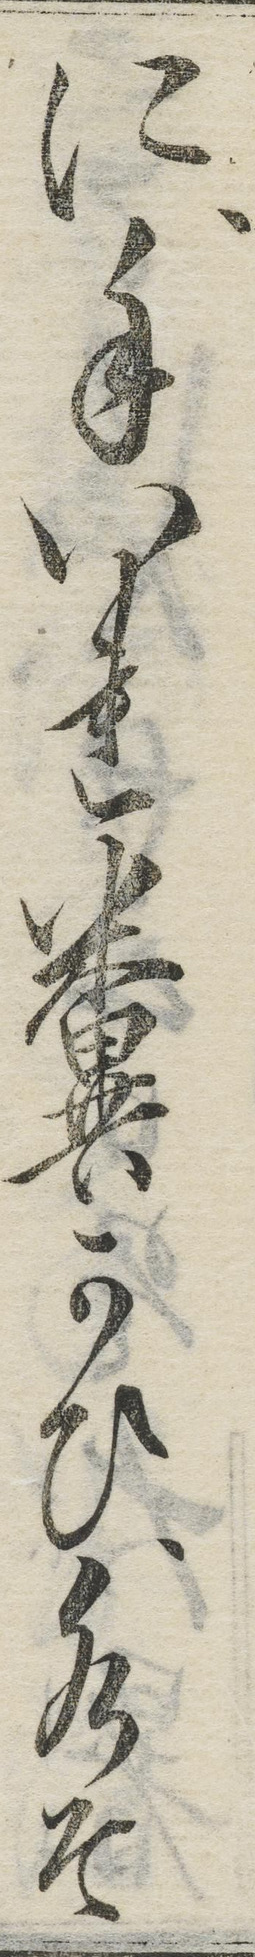に、手いれ糞かひ、水そ
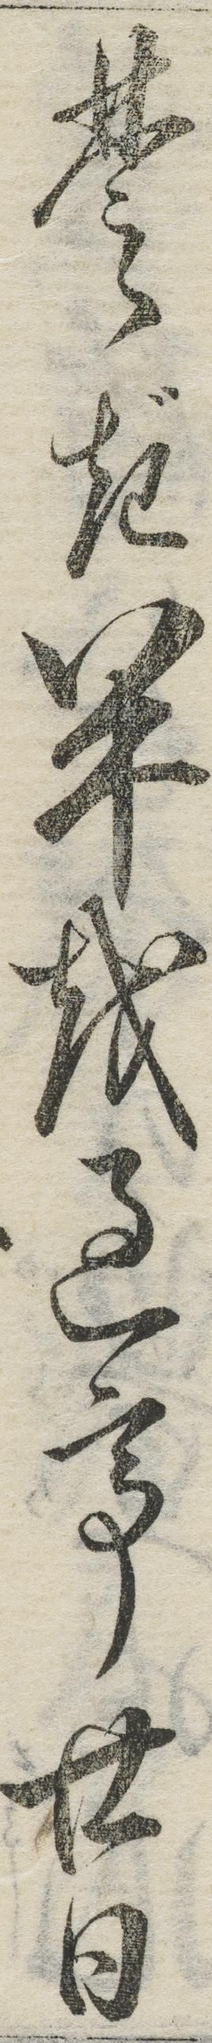そぎ、半を過て廿日
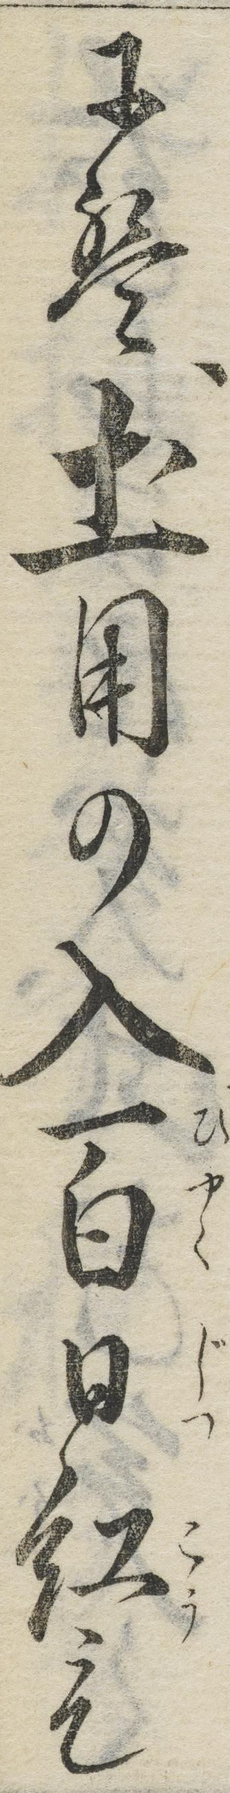には、土用の入、百日紅も
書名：暦日往来　單
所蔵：東京大学地震研究所図書室 Earthquake Research Institute Library, The University of Tokyo, JAPAN
